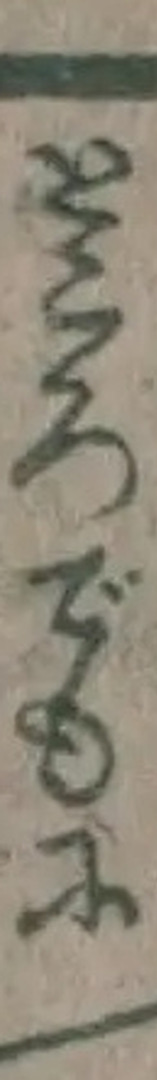ところでもに
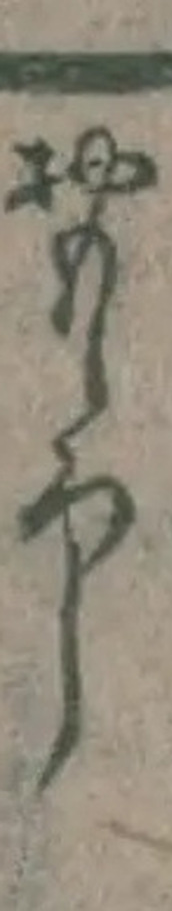おもしろし
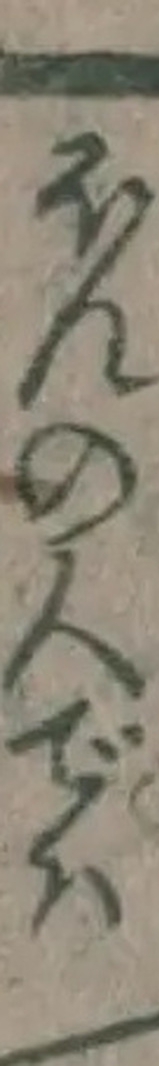ほんの人では
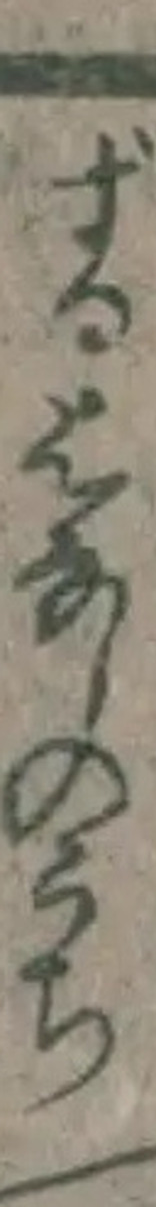ずるはなしのうち
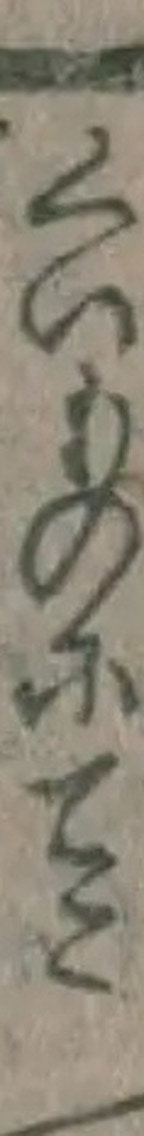くいものにてこ
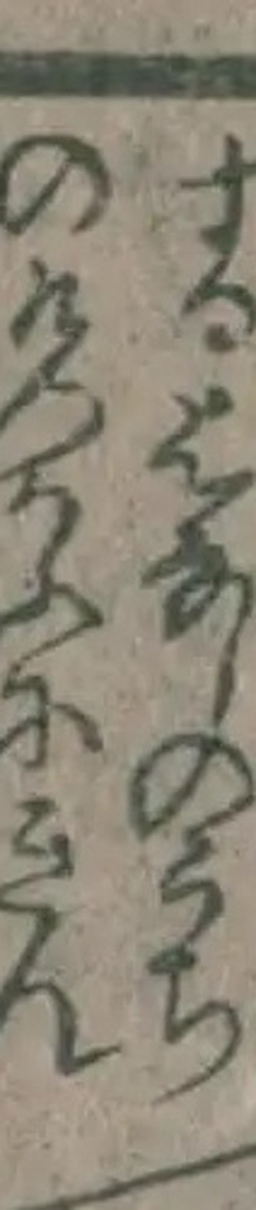のけつかふにきん
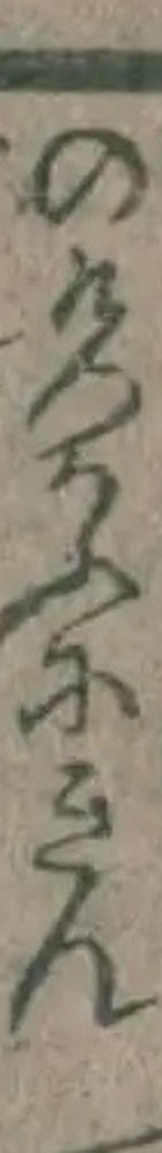のけつかふにきん
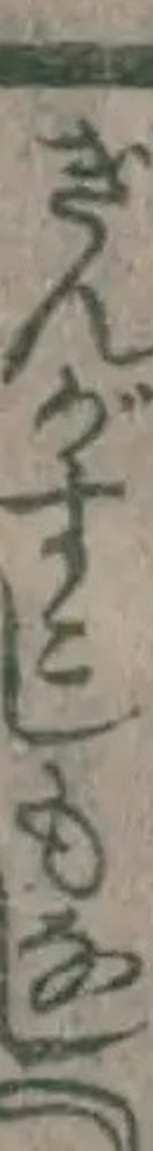ぎんがすこしもなし
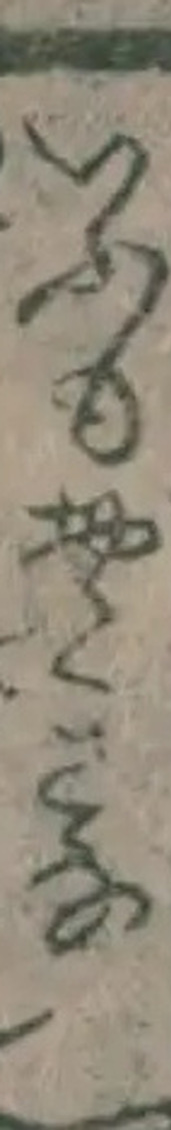いふもおゝきな
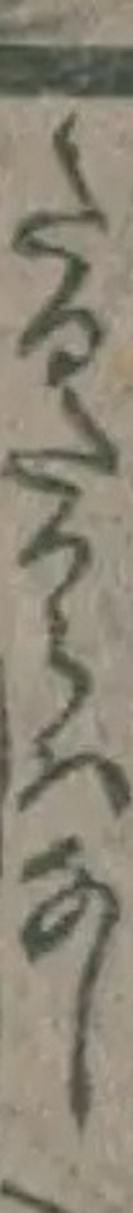たるたからはなし
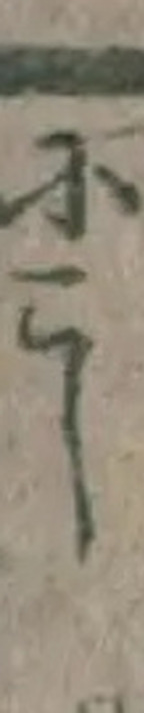にこし
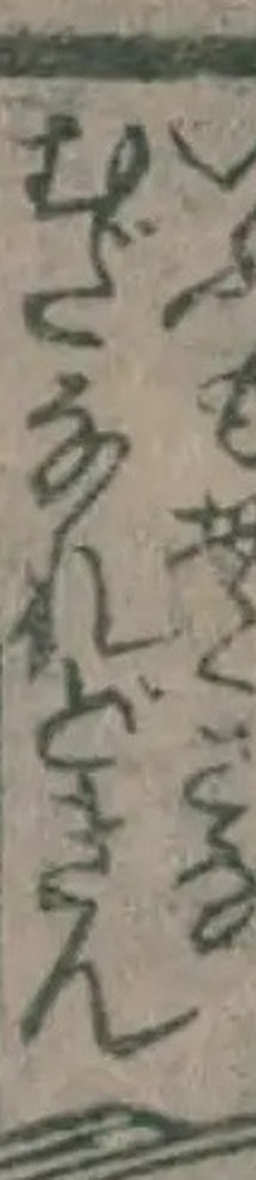むだなれどきん
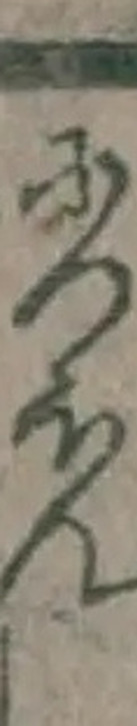につほん
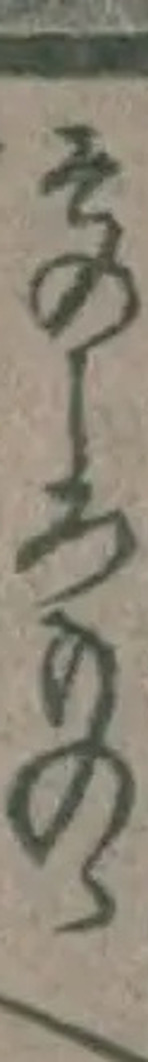そのしろものゝ
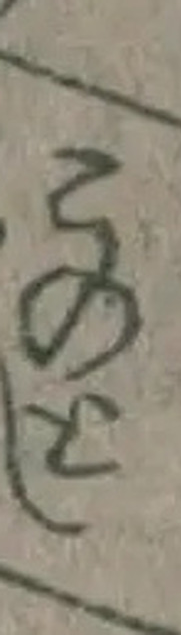このとし
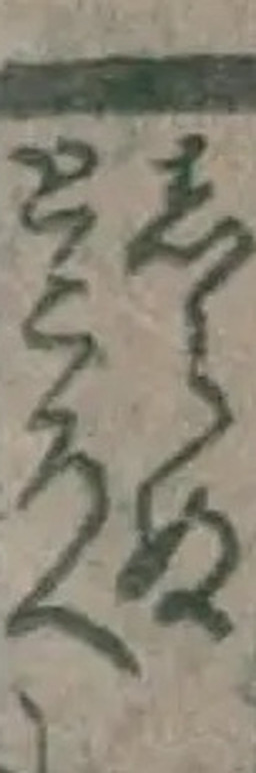ところへ
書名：縦筒放唐の噺 3巻
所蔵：国立国会図書館 National Diet Library, JAPAN
